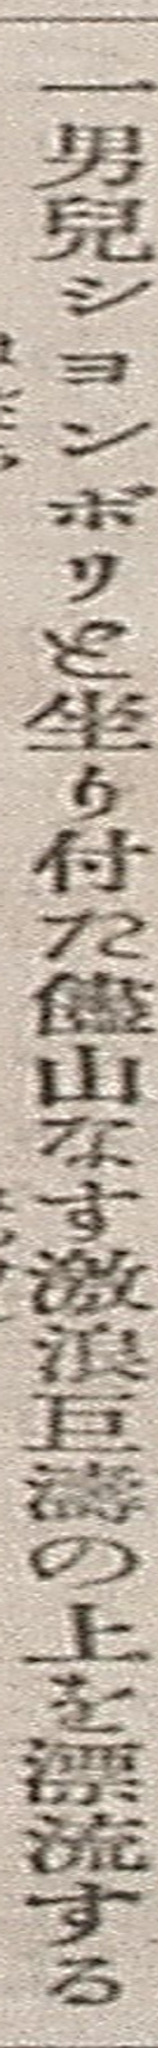一男児ションボリと坐り付た侭山なす激浪巨濤の上を漂流する
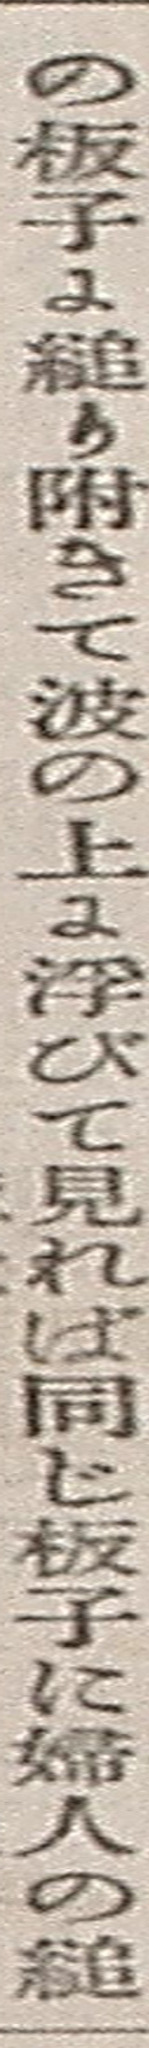の板子に縋り付きて波の上に浮びて見れば同じ板子に婦人の縋
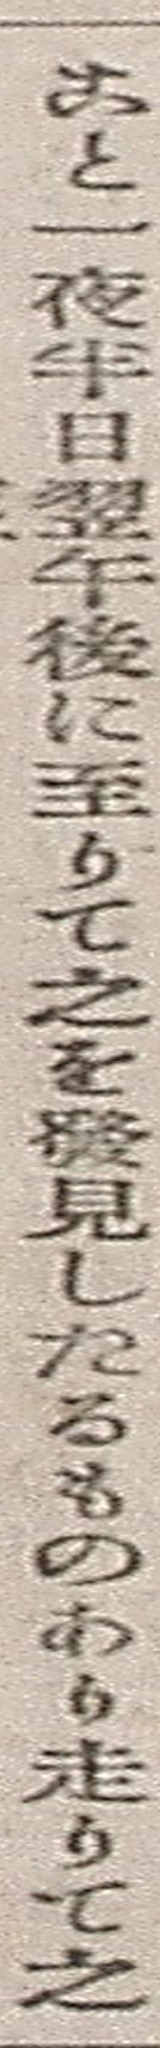こと一夜半日翌午後に至りて之を発見したるものあり走りて之
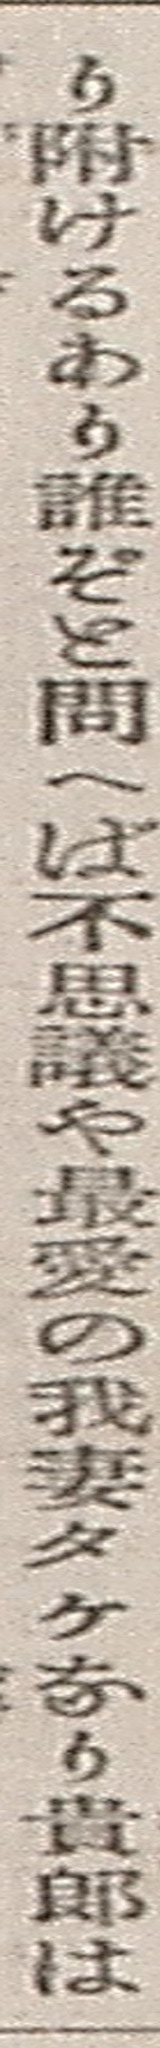り付けるあり誰ぞと問へば不思議や最愛の我妻タケなり貴郎は
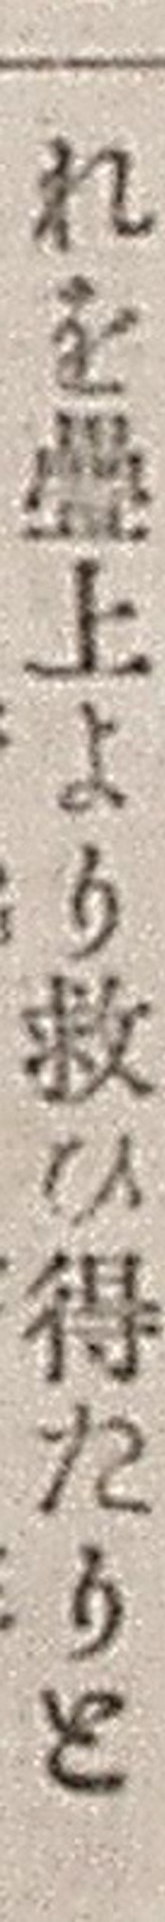れを畳上より救ひ得たりと
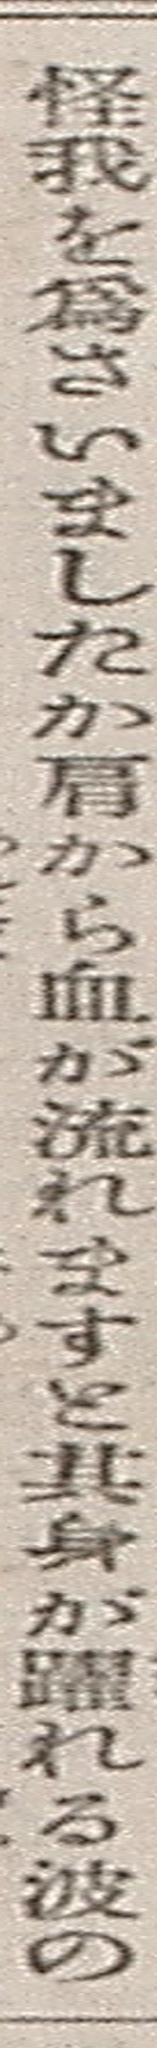怪我を為さいましたか肩から血が流れますと其身が躍れる波の
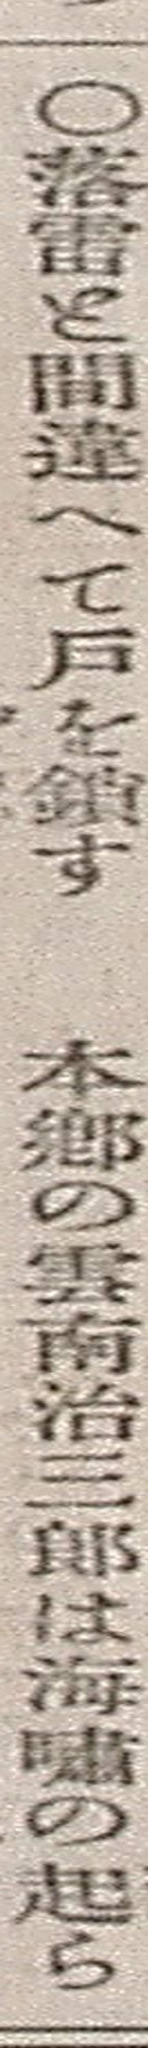○落雷と間違へて戸を鎖す本郷の雲南治三郎は海嘯の起ら
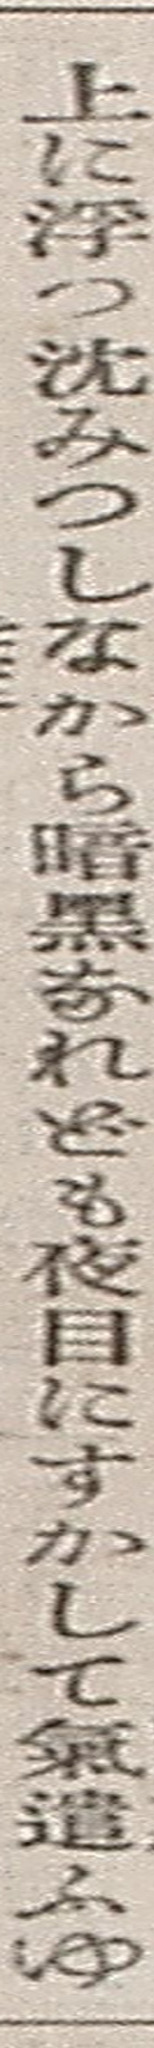上に浮つ沈みつしなから暗黒なれども夜目にすかして気遣ふゆ
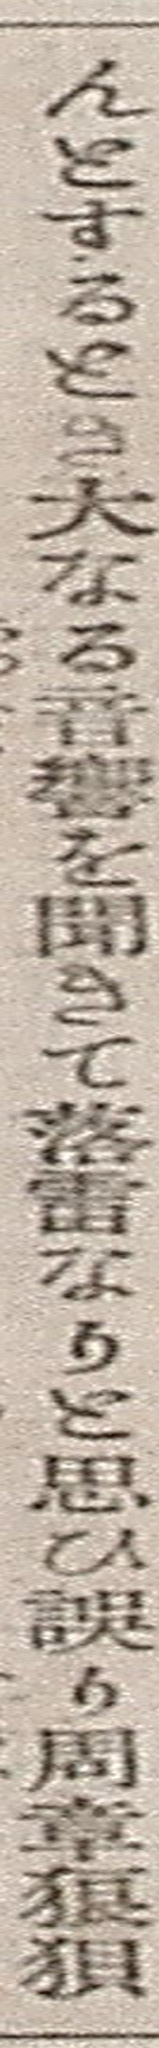んとするとき大なる音響を聞きて落雷なりと思ひ誤り周章狼狽
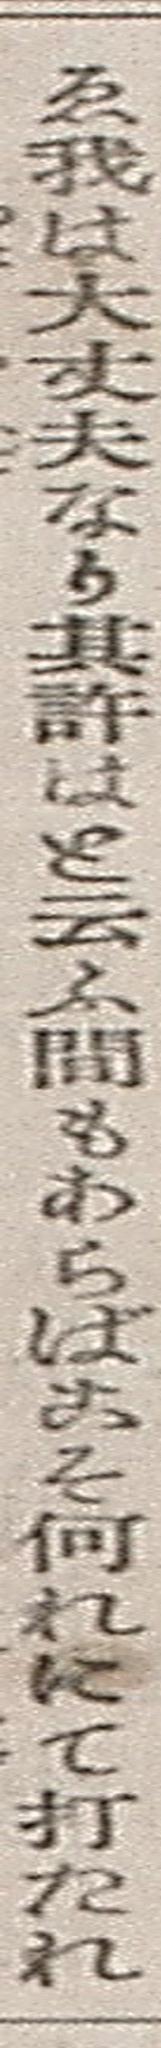ゑ我は大丈夫なり其許はと云ふ間もあらばこそ何れにて打たれ
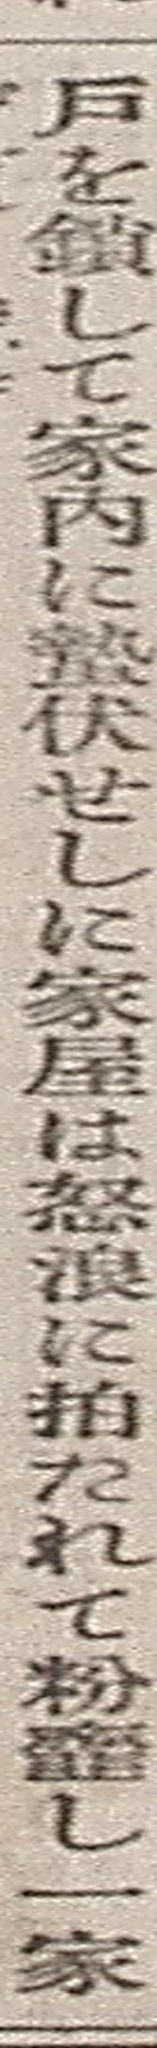戸を鎖して家内に蟄伏せしに家屋は怒浪に拍たれて粉韲し一家
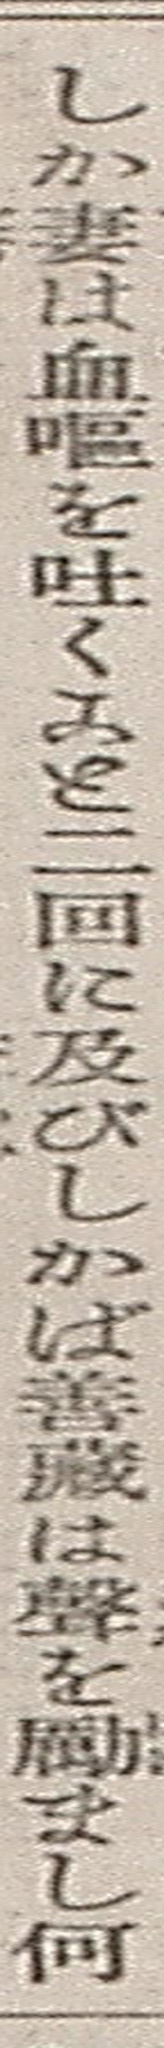しか妻は血嘔を吐くこと二回に及びしかば善蔵は声を励まし何
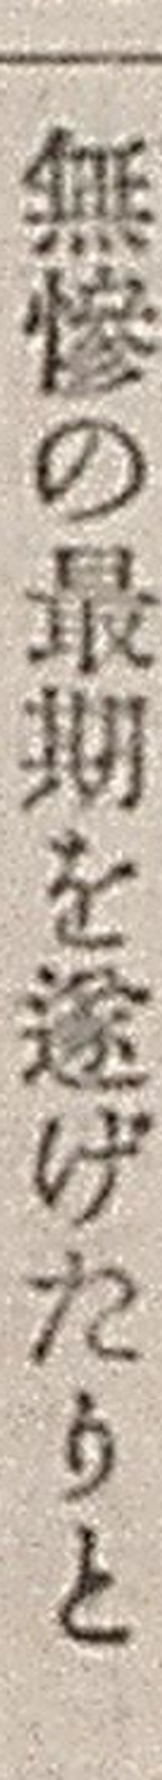無惨の最後を遂げたりと
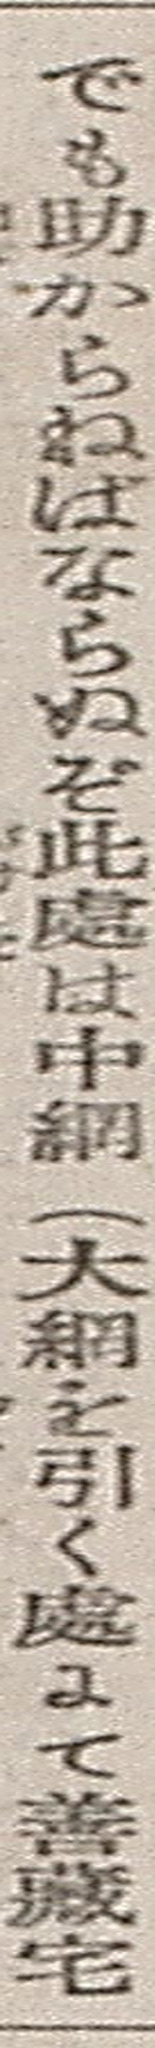でも助からねばならぬぞ此処は中網（大網を引く処にて善蔵宅
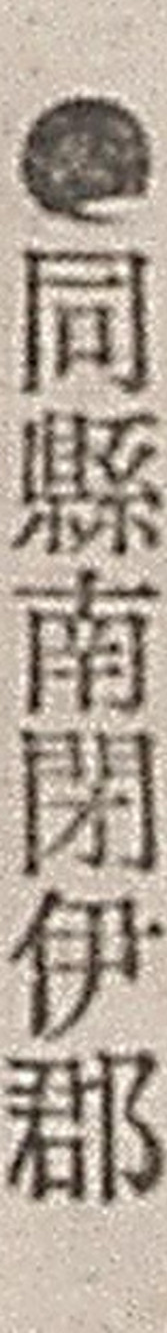●同県南閉伊郡
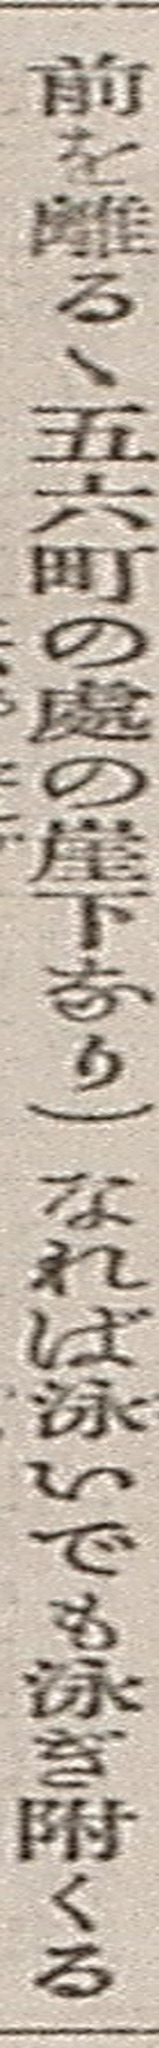前を離る五六町の処の崖下なり）なれば泳いでも泳ぎ付くる
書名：風俗畫報臨時増刊第百十九號　大海嘯被害録（中）
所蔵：東京大学地震研究所図書室 Earthquake Research Institute Library, The University of Tokyo, JAPAN
